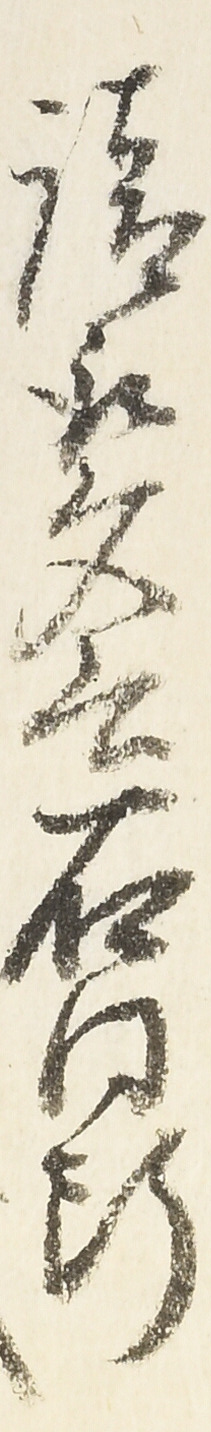請取文言右同断
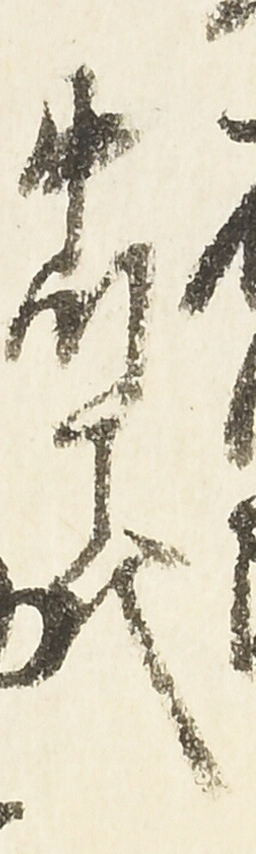中町丁代
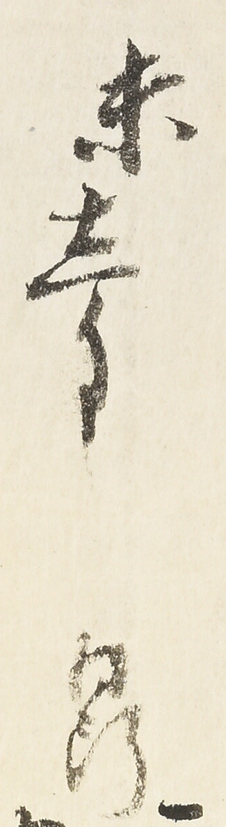十二月同断
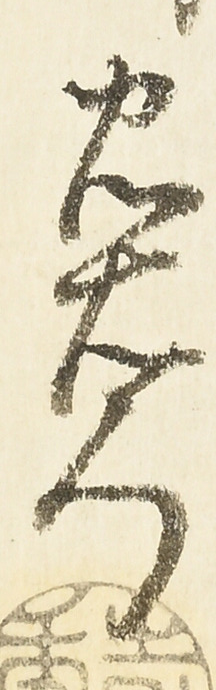忠右衛門
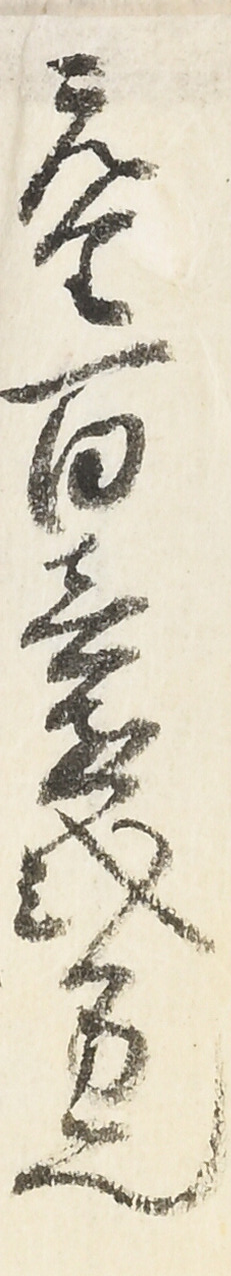元金百壱両弐分也
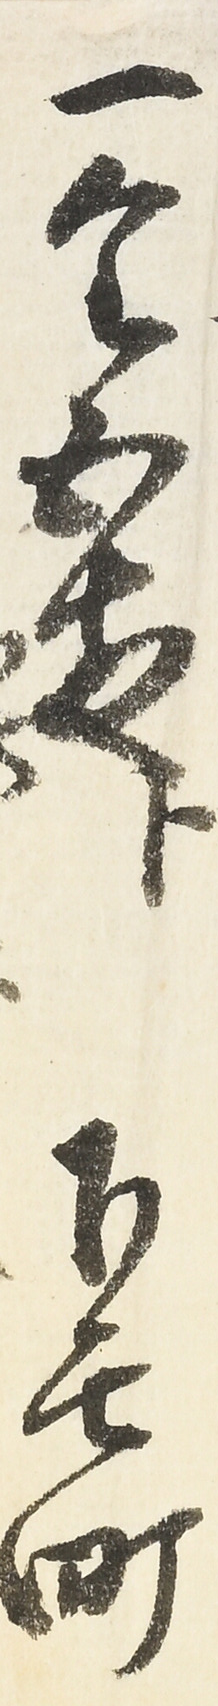一金五両ト下モ町
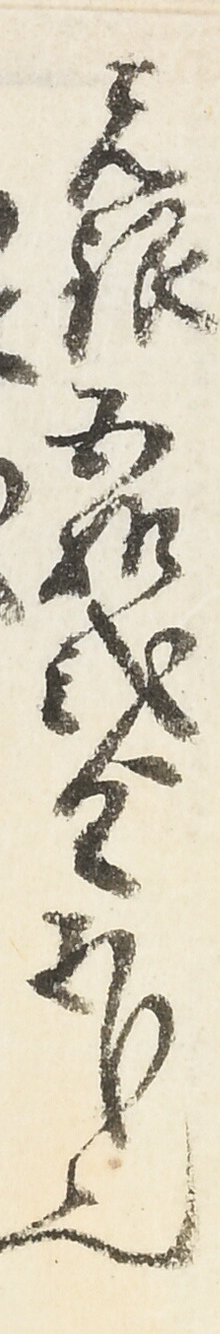元銀五拾弐匁五分也
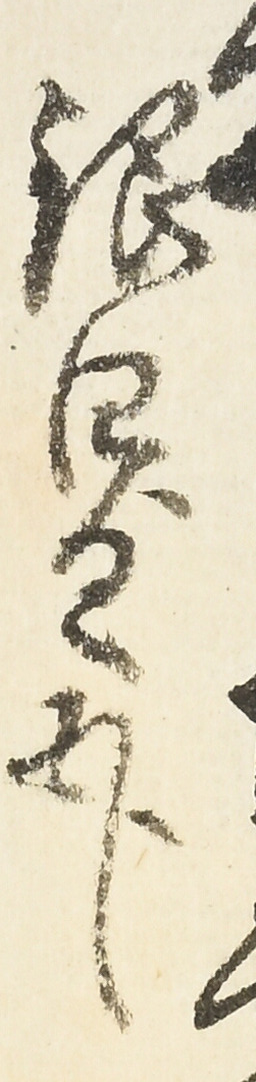銀四匁五分
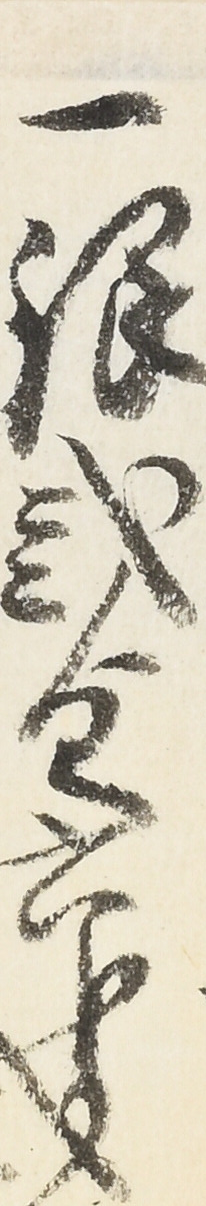一銀弐匁六分弐厘五毛
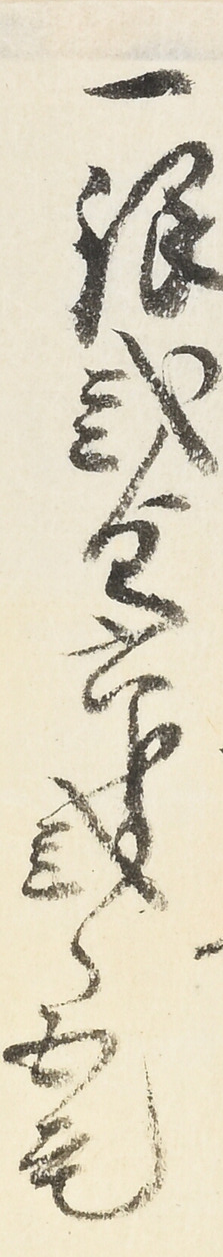一銀弐匁六分弐厘五毛
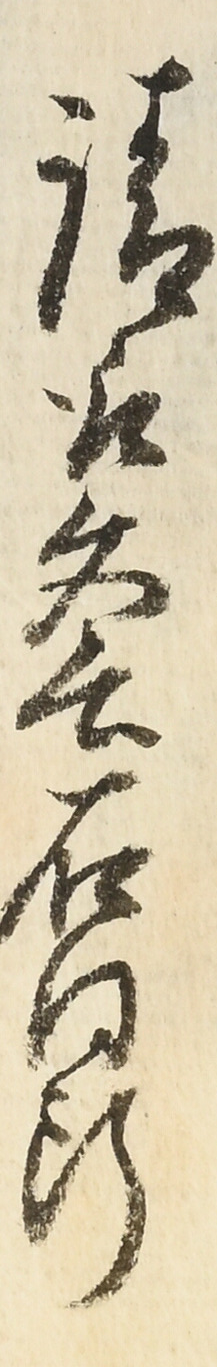請取文言右同断
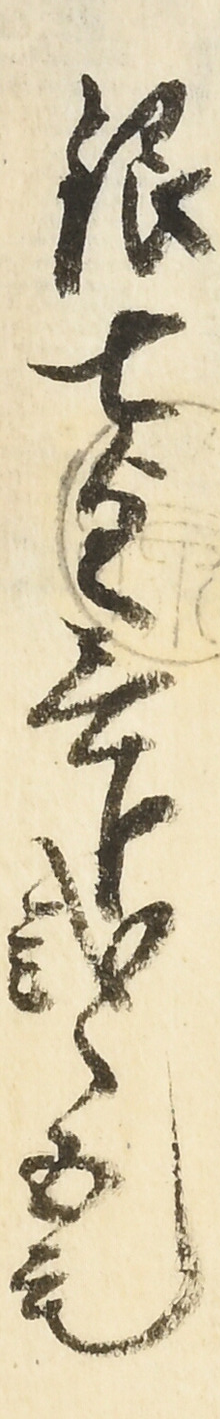一銀弐匁六分弐厘五毛

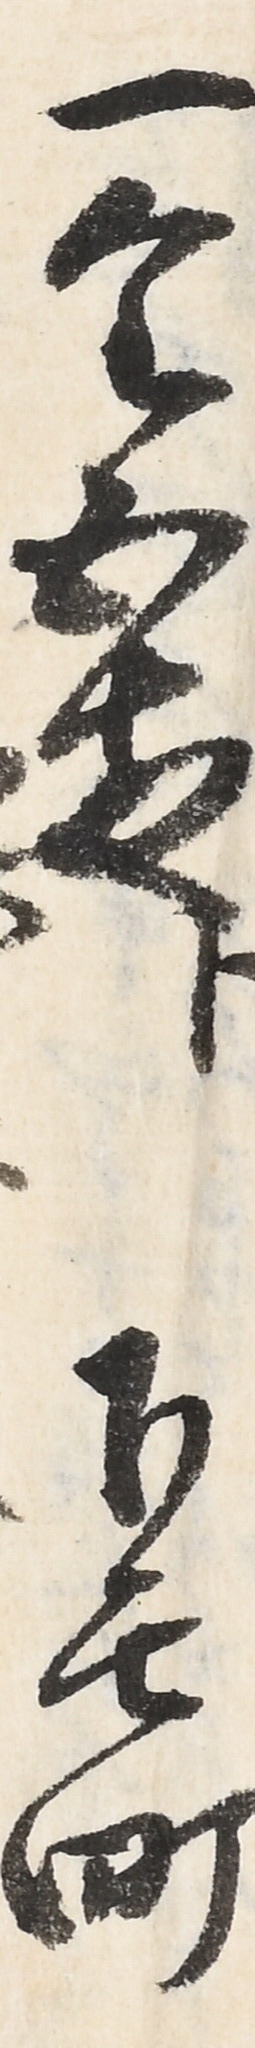一金壱両ト新町
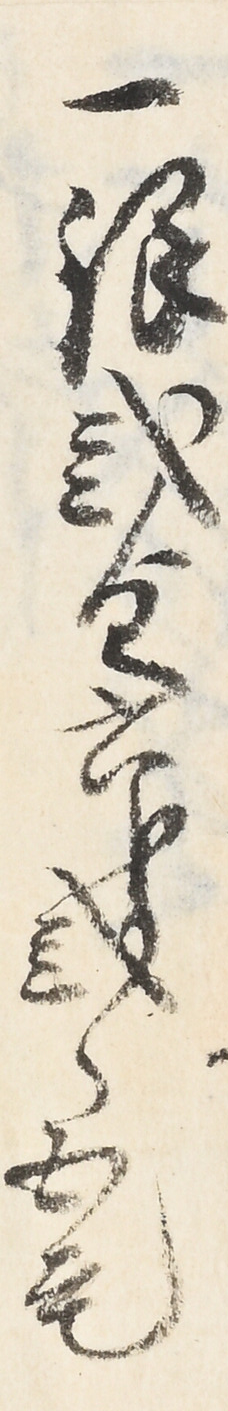一銀弐匁五分弐厘五毛
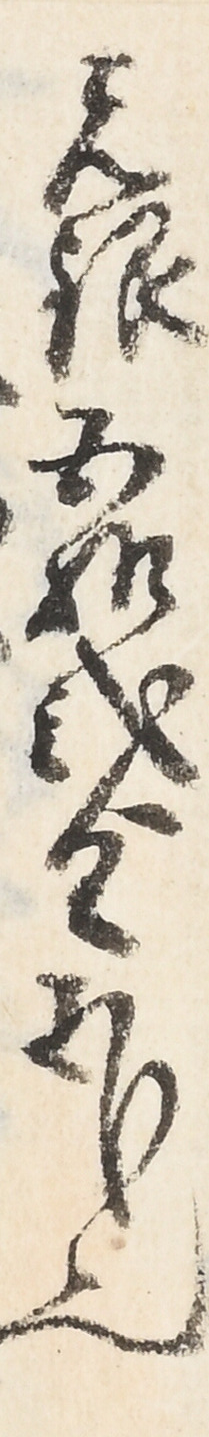元銀五拾匁五分也
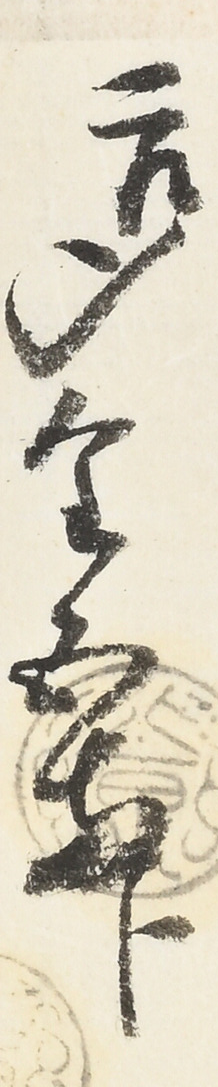ニ口〆金五両ト
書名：御才覚金御利足割渡扣帳
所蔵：伊那市立高遠町図書館・合同会社AMANE
